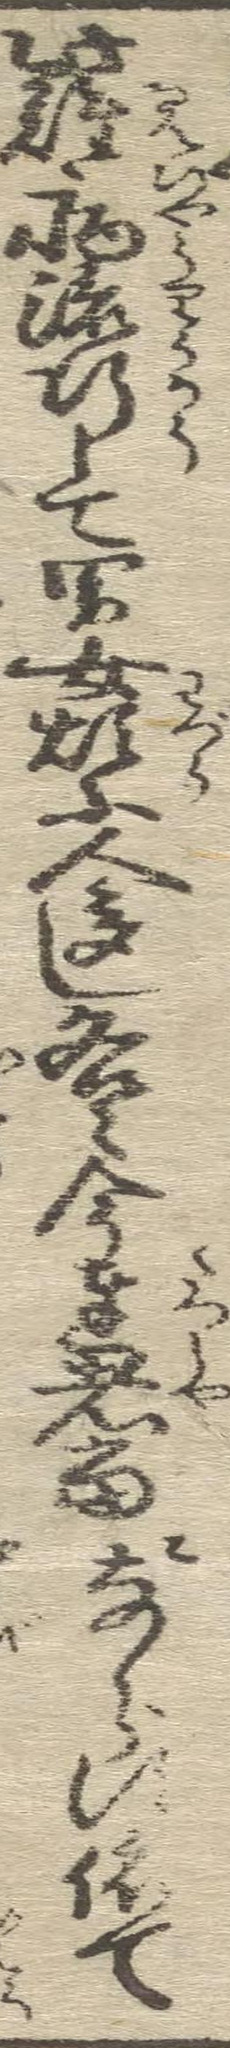此難病流行して男女煩ふ人多し各々今達者当にならす依て
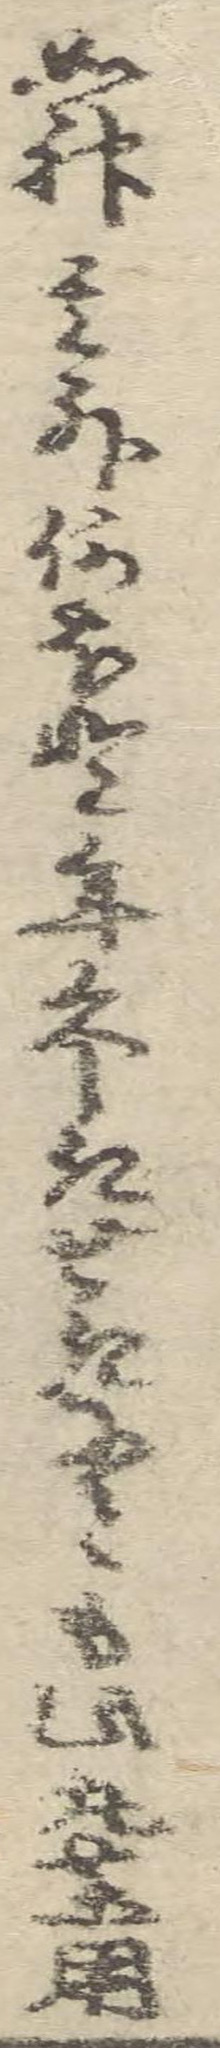如神其外何ほと年久しきせきにても此丸薬用
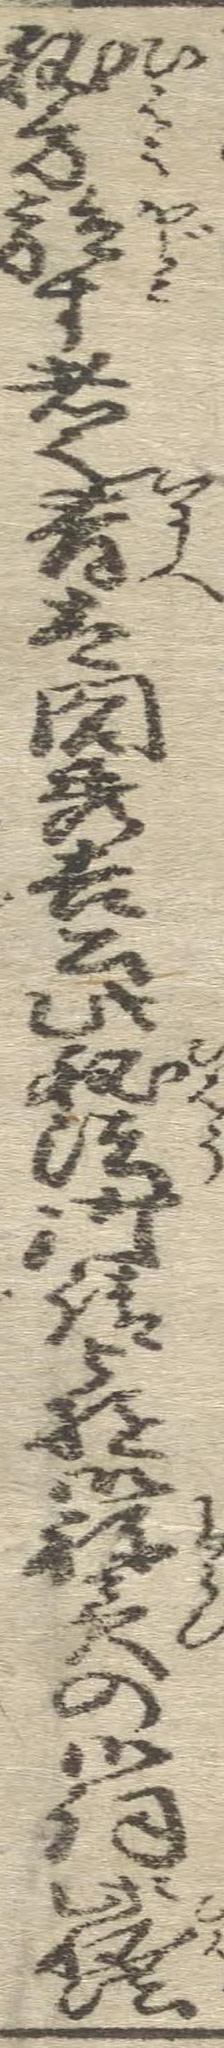秘方施す者也昔太閤秀吉此秘方御請被遊御称美の御詞に此秘方
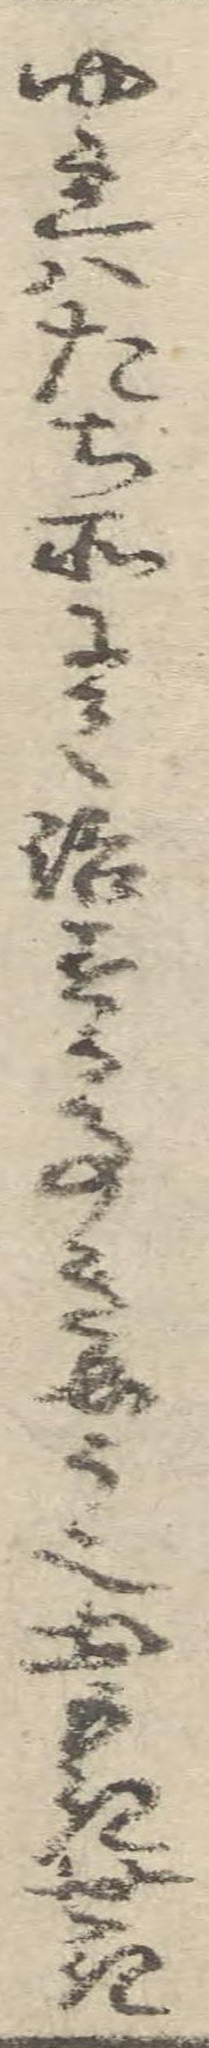ゆれはたち所にて治する事きめう也おもきせき
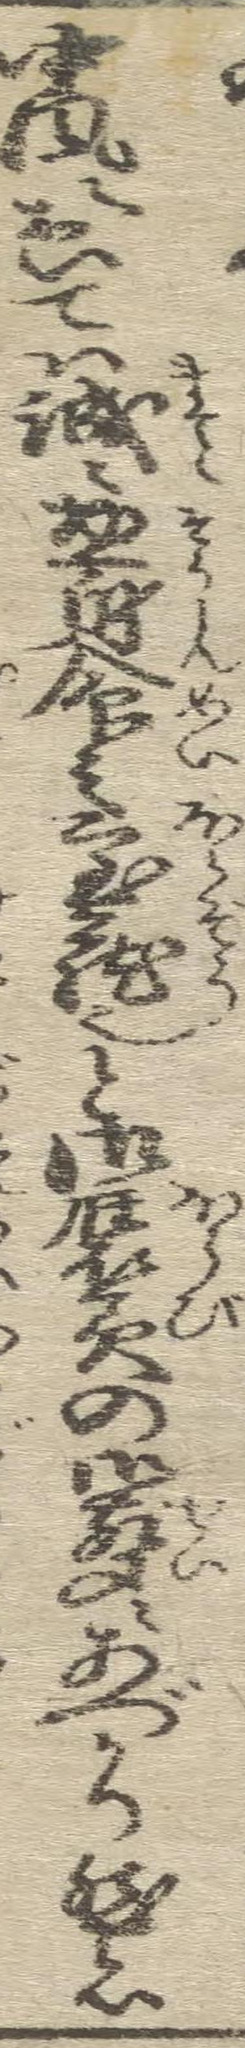中風においては誠に惣身命之宝蔵也と御褒美の御声にあづかり然者
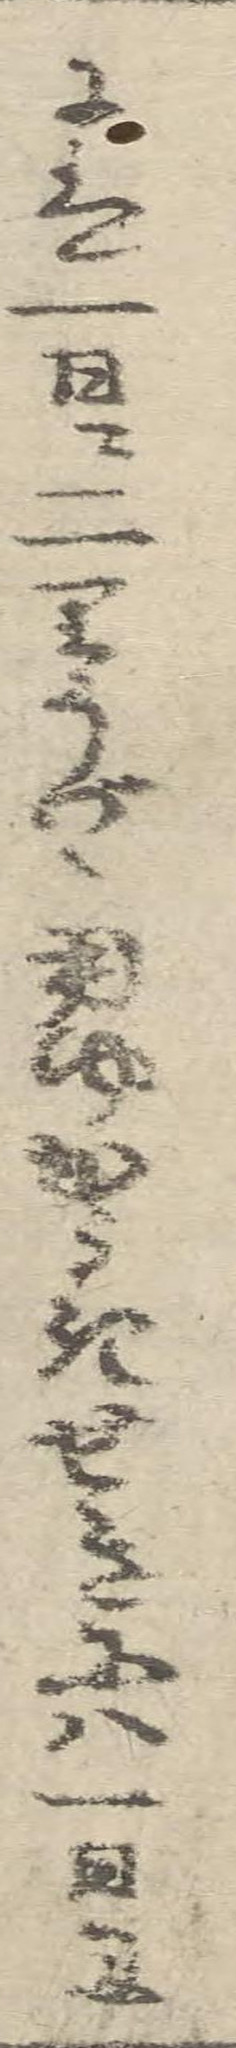には一日に二りうづゝ用ゆかるきせきには一日に
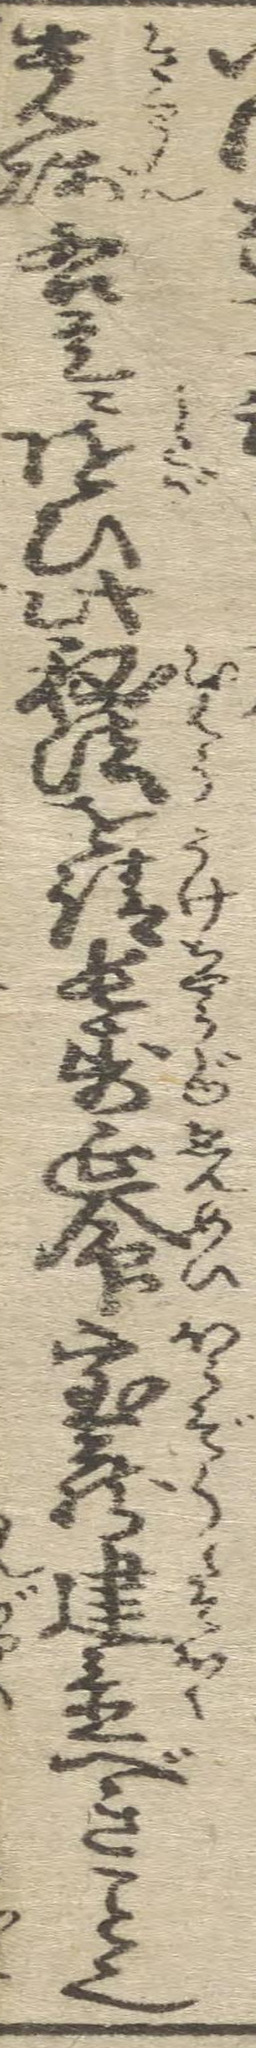貴賎各是に随ひ此秘法を請長寿延命宝蔵建置べきこと也
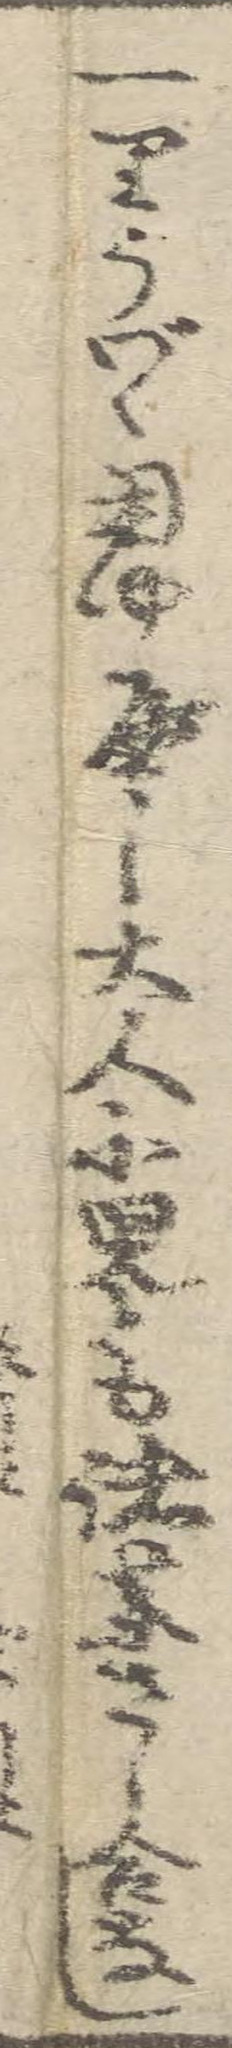一りうづゝ用ゆべし大人小児とも諸薬さし合なし
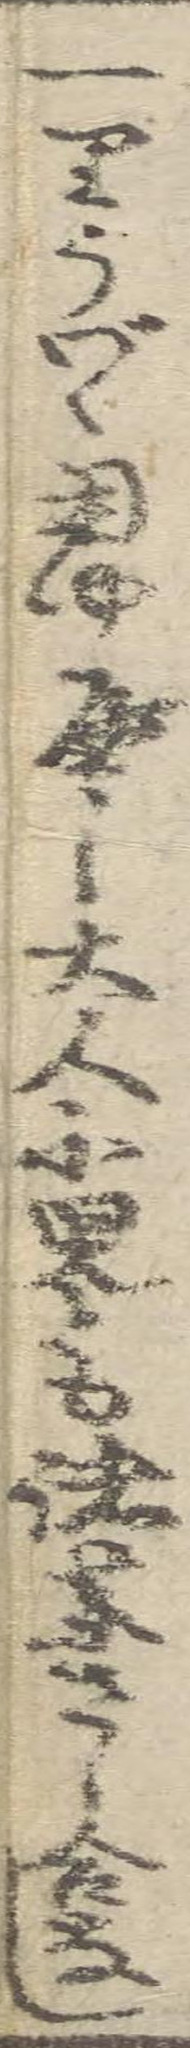一りうづゝ用ゆべし大人小児とも諸薬さし合なし
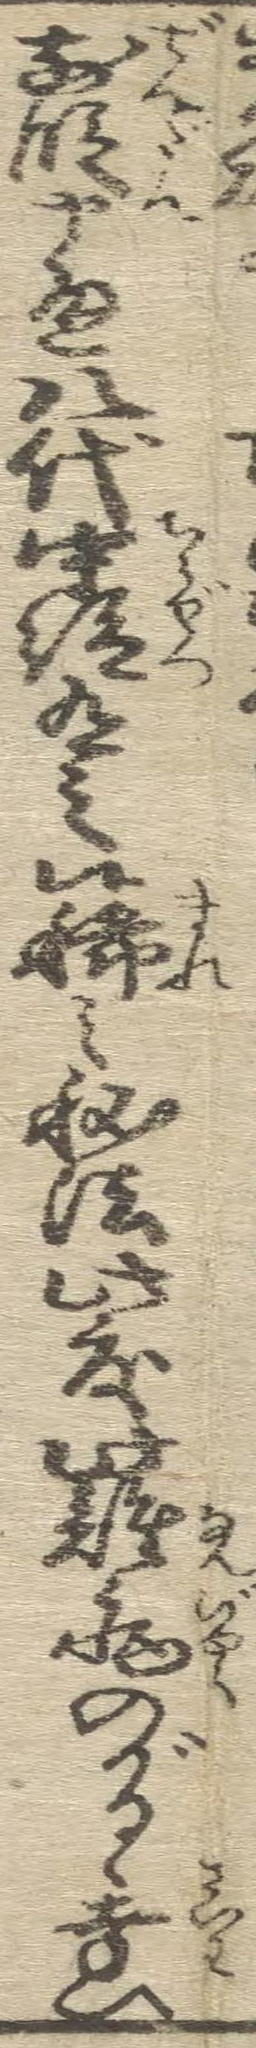前段申通八代中絶有之候稀之秘法此度此難病のがるゝ幸ひ
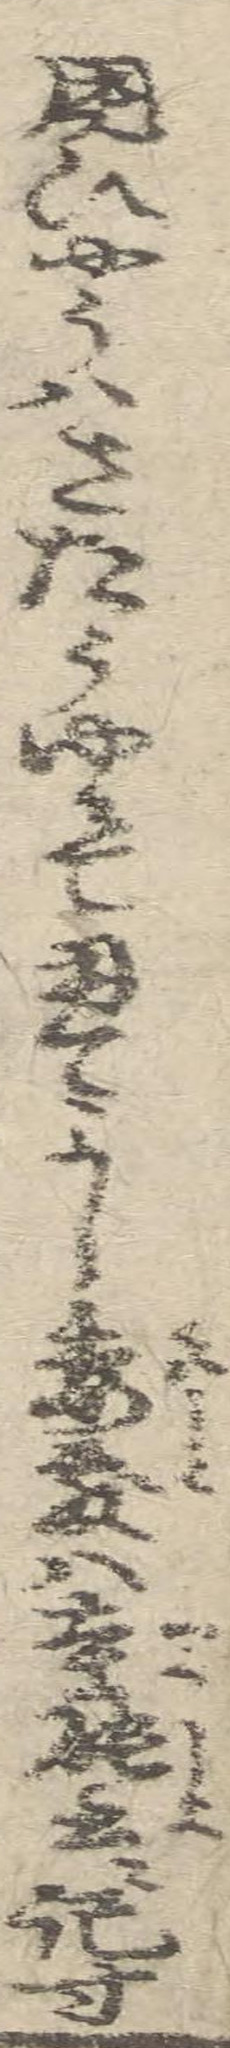用ひやうはさたうゆにて用てよし委敷は本能書に記す
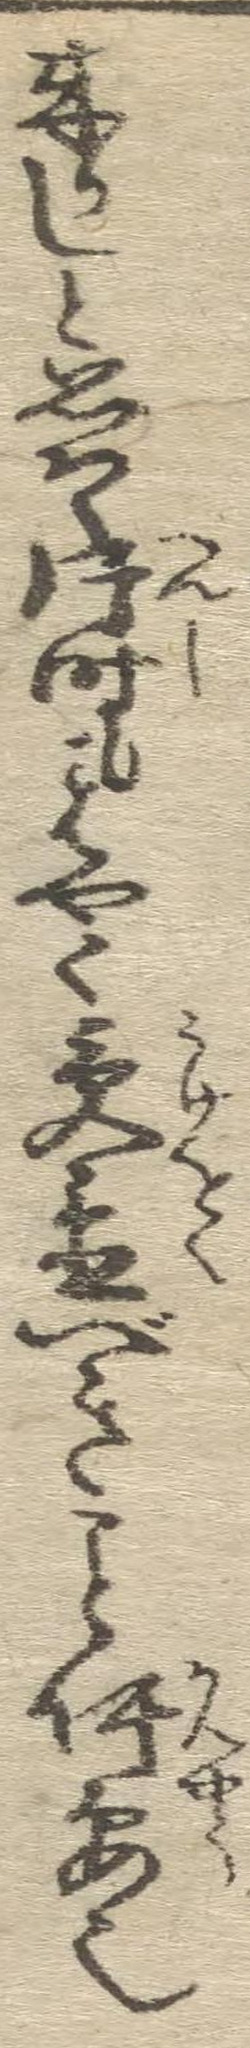来りしと思はゝ片時もはやく受置べきこと肝要也
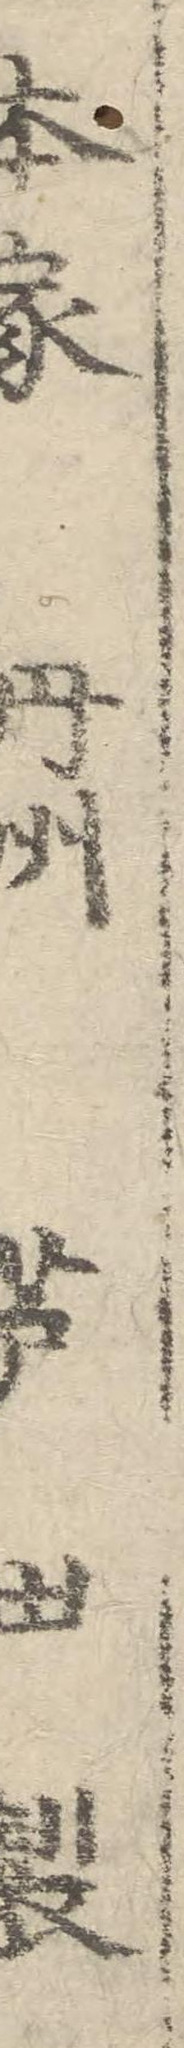本家丹州芦田製
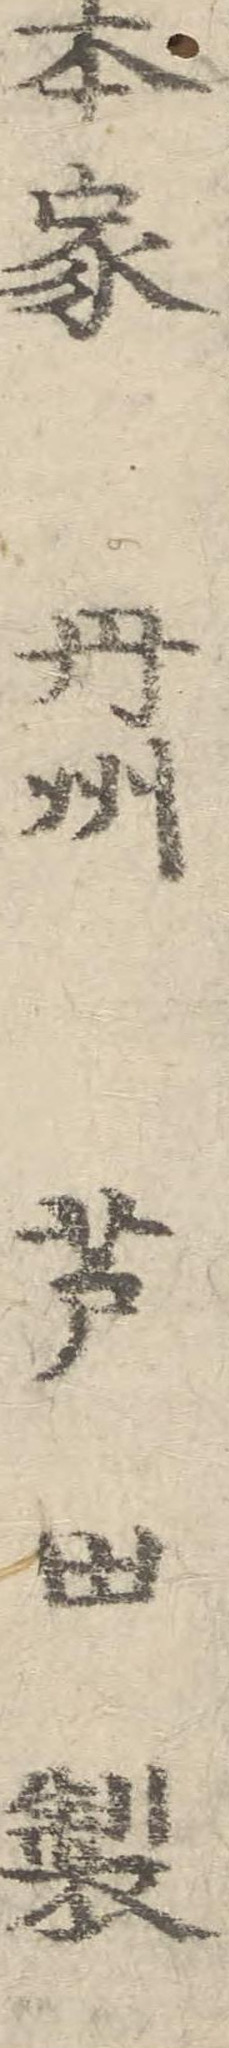本家丹州芦田製
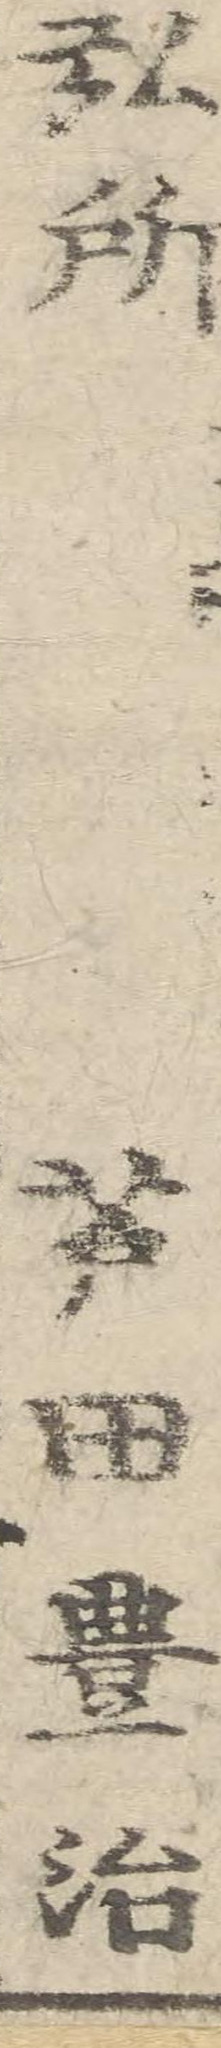弘所芦田豊治
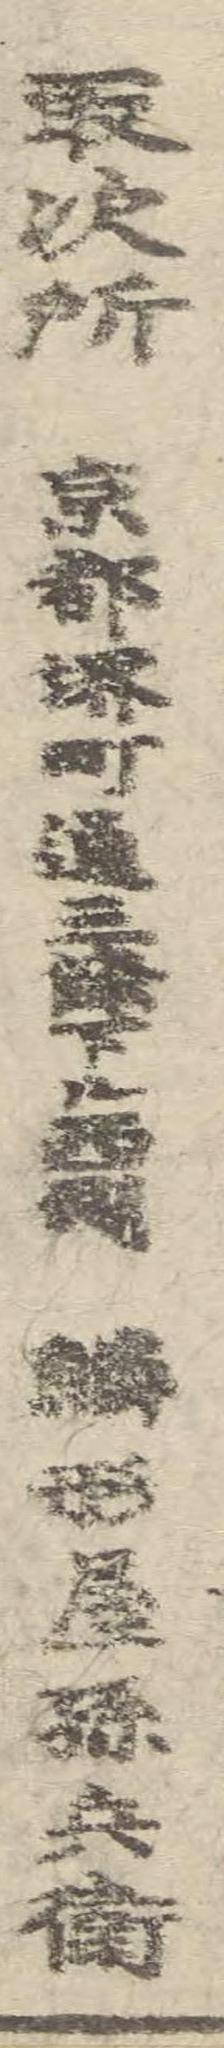取次所京都堺町通三条下る西側鱗形屋孫兵衛
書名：浪華薬種問屋能書張交帖. 二
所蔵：国立国会図書館 National Diet Library, JAPAN
